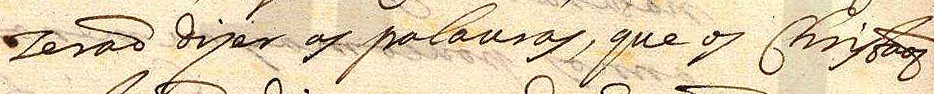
zeraõ dizer as palauras, que os Christaõs
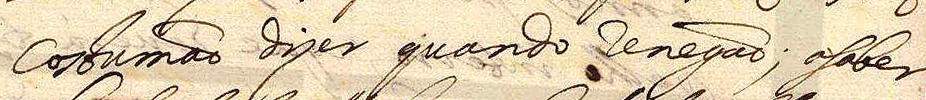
costumaõ dizer quando Renegaõ, a saber
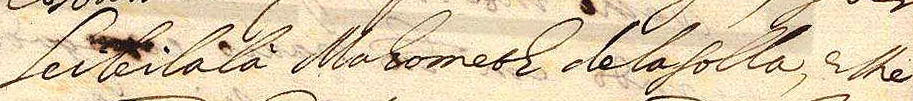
Leileilalá Mahometh delasolla, E lhe
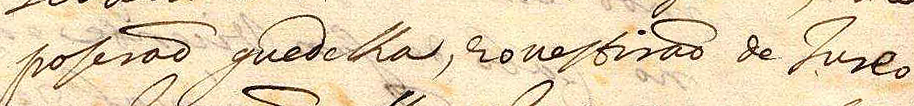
poserão guedelha, E o uestirão de turco
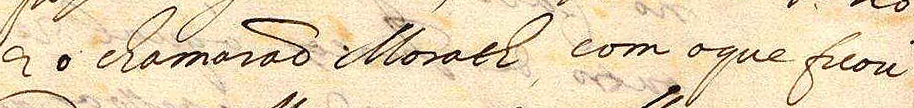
E o chamaraõ Morath com o que ficou
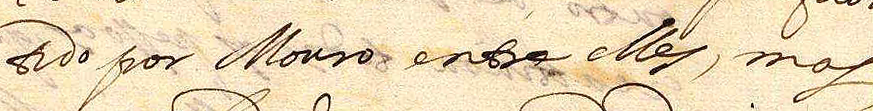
tido por Mouro entre elles, mas
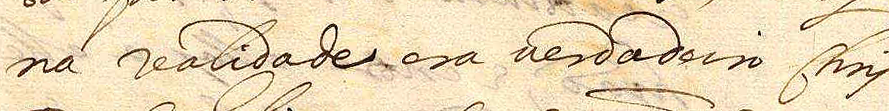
na realidade era uerdadeiro Chris
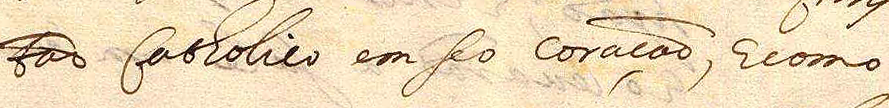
tão Catholico em seo coração, E como
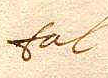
tal
